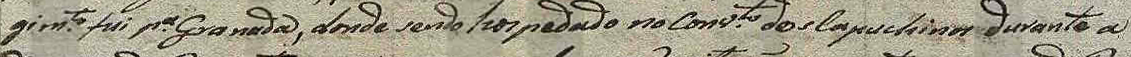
gim.to fui p.a Granada, donde sendo hospedado no conv.to dos Capuchinos durante a
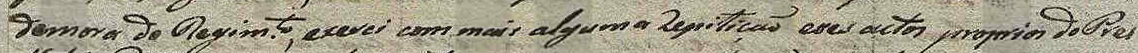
demora do Regim.to, exerci com mais alguma Repitiçaõ esses actos proprios do Pres
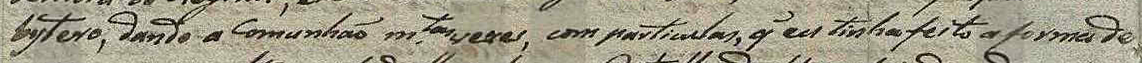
bytero, dando a Comunhaõ m.tas vezes, com particulas, q̄ eu tinha feito a forma de
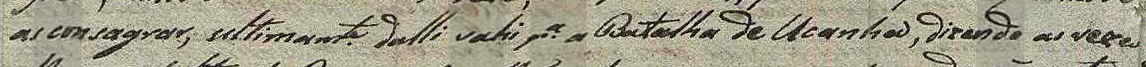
as consagrar, ultimam.te dalli sahi p.a a Batalha de Ucanha, dizendo as vezes
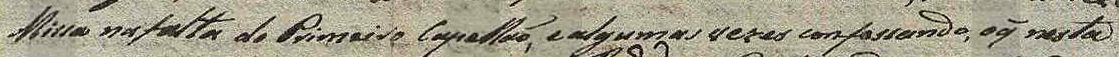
Missa na falta do Primeiro Capellaõ, e algumas vezes confessando, o q̄ nesta
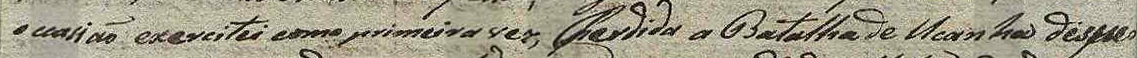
occasiaõ exercitei como primeira vez, Perdida a Batalha de Ucanha despe
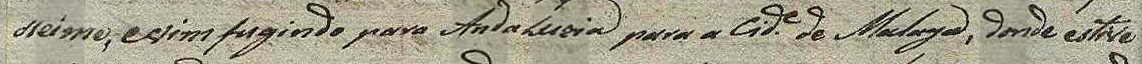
sseime, e vim fugindo para AndaLuzia para a Cid.e de Malaga, donde estive
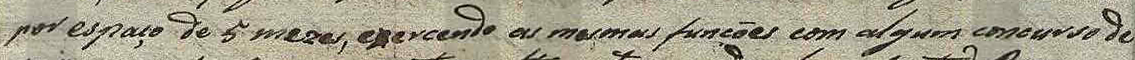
por espaço de 5 mezes, exercendo as mesmas funções com algum concurso de
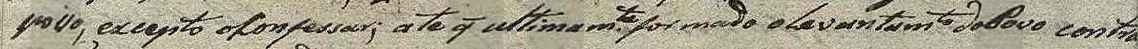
povo, excepto o Confessar; ate q̄ ultimam.te formado o Lavantamto do Povo contra
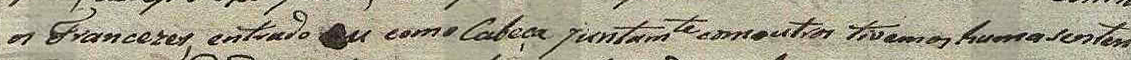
os Francezes, entrado _u como Cabeça juntam.te com outros tivemos huma senten
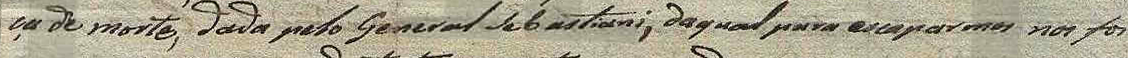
ça de morte, dada pelo General sebastiani, da qual para escaparmos nos foi
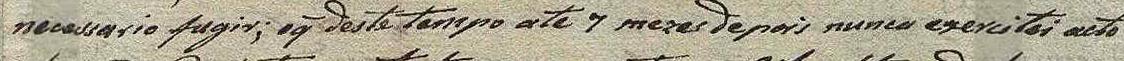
necessario fugir; o q̄ deste tempo ate 7 mezes depois nunca exercitei acto
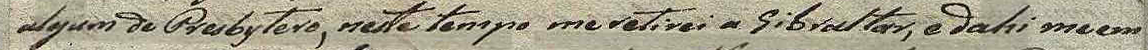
algum de Presbytero, neste tempo me retirei a Gibraltar, e dahi me em
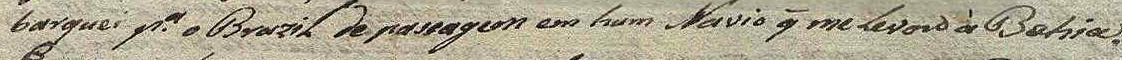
barquei p.a o Brazil de passagem em hum Navio q̄ me Levou à Bahia.
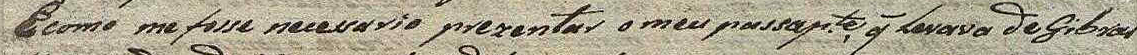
E como me fosse necessario prezentar o meu passap.te, q̄ levava de Gibral
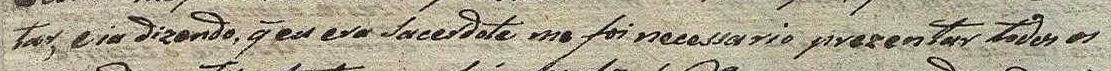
tar, e ia dizendo, q̄ eu era sacerdote me foi necessario prezentar todos os
